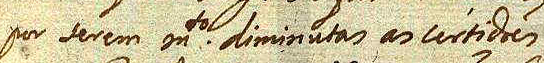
por serem m.to diminutas as certidoẽs
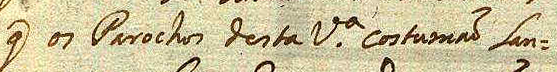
q̄ os Parochos desta V.a costumaõ lan
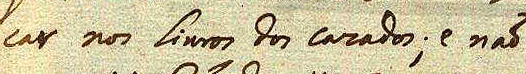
çar nos liuros dos cazados; e naõ
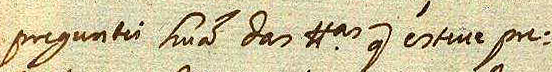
preguntei huā das tt.as q̄ esteue pre
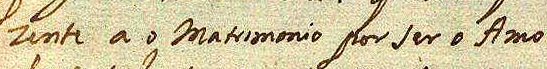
zente ao matrimonio por ser o Amo
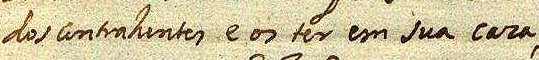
dos contrahentes e os ter em sua caza;
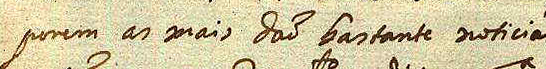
porem as mais daõ bastante noticia
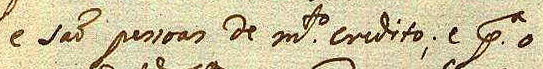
e saõ pessoas de mt.o credito; e p.a o
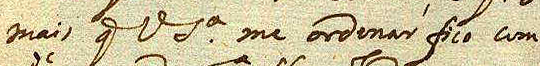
mais q̄ V S.a me ordenar fico com
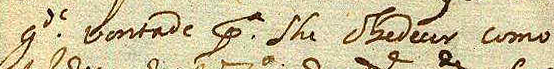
gd.e vontade p.a lhe obedecer como
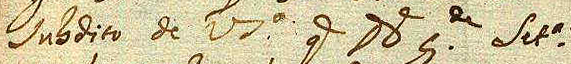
Subdito de V S.a q̄ Ds̄ g.de Seta.l
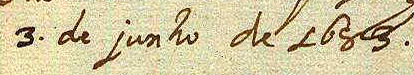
3. de junho de 1683.
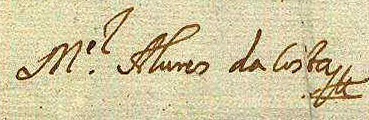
M.el Alures da Costa
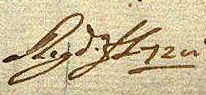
Regd.a fl 72 uo
